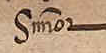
Snn̄or
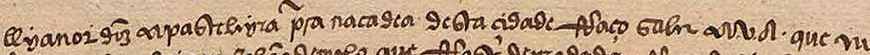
llyanor dīz a pasteleyra p̄sa na cadea desta cidade ffaço saber a v A. que eu
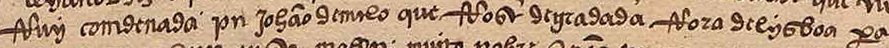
ffuy comdenada per Johão de melo que ffose degradada ffora de lysboa ꝑa
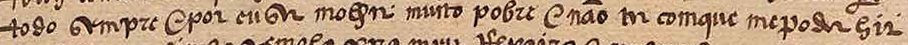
todo sempre e por eu ser molher muito pobre e não ter com que me poder hir
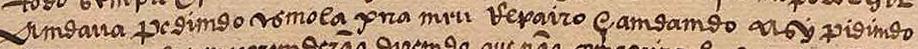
amdaua pedimdo esmola pera meu Repairo e amdamdo asy pidimdo
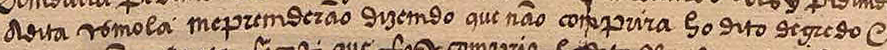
A dita esmola me premderão dizemdo que não comprira ho dito degredo e
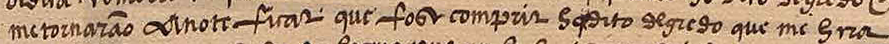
me tornarão a noteficar que fose comprir ho dito degredo que me hera
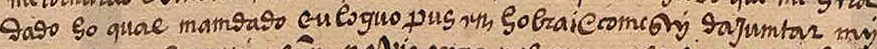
dado ho qual mandado eu loguo pus em hobra, e comesey daJumtar my
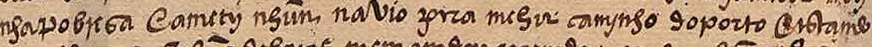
nha pobresa e a mety nhum navio pera me hir camjnho do porto e estando
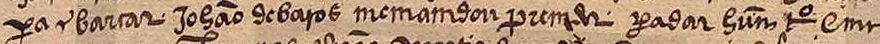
ꝑa ēbarcar Johão de baros me mamdou premder ꝑa dar hum to e me
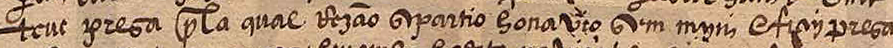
teue presa p̄la qual Rezão se partio ho navio sem mym e ficey presa
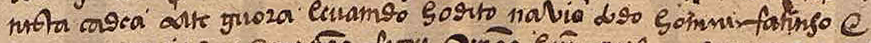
nesta cadea ate guora leuamdo ho dito navio todo ho meu fatinho e
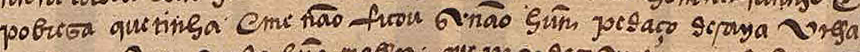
pobresa que tinha e me não ficou senão hum pedaço de saya Velha
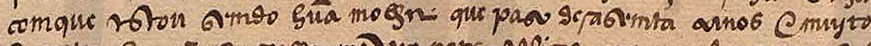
com que estou semdo hūa molher que paso de sasemta anos e mujto
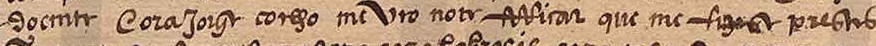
doemte e ora Jorge coelho me veo noteffficar que me fizese prestes
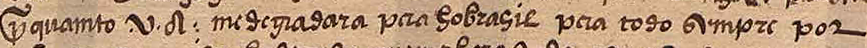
p̄oquamto .V. A. me degradara pera ho brasil pera todo sempre por
